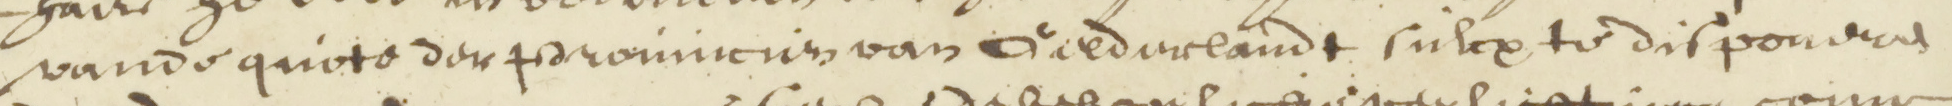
vande quote der prouincien van Gelderlandt sulcx te disponeren
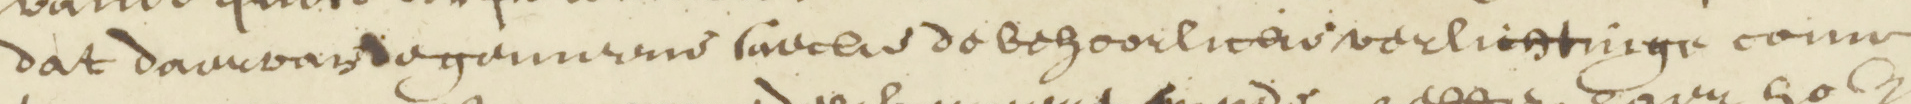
dat daervan de gemeene saecke de behoorlicke verlichtinge come
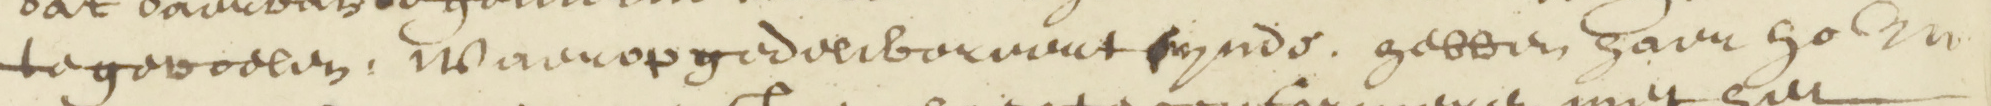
te gevoelen. Waerop gedelibereert synde, hebben haer hoM:
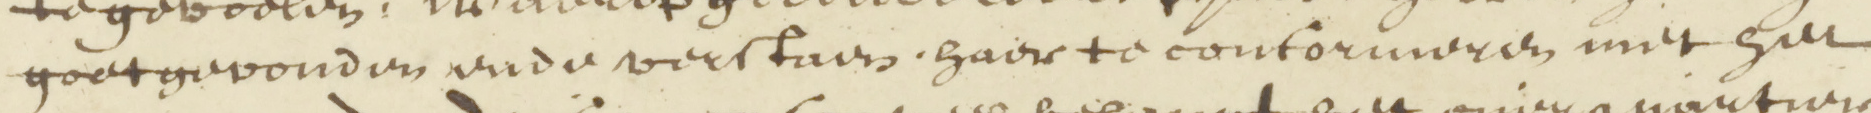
goetgevonden ende verstaen, haer te conformeren met het
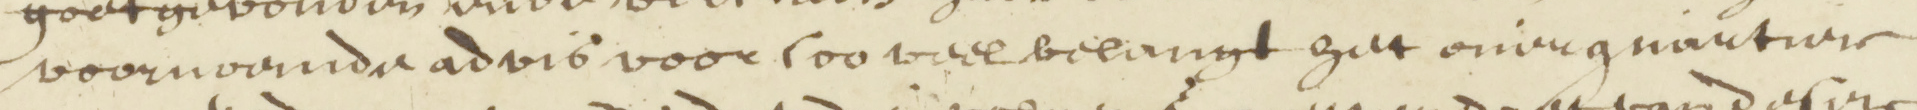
voornoemde advis voor soo veel belangt het ouerquartier
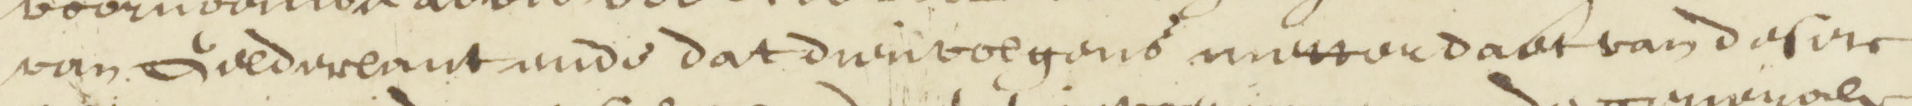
van Gelderlant ende dat dienvolgens metterdaet van deser
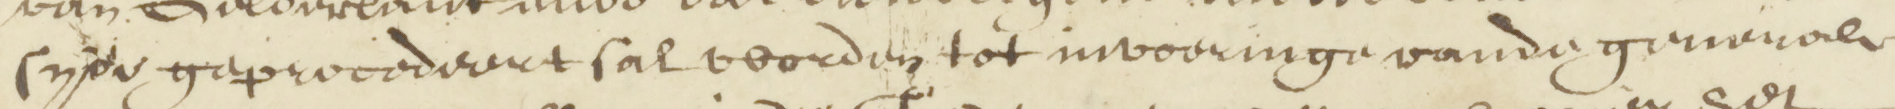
syde geprocedeert sal worden tot invoeringe vande generale
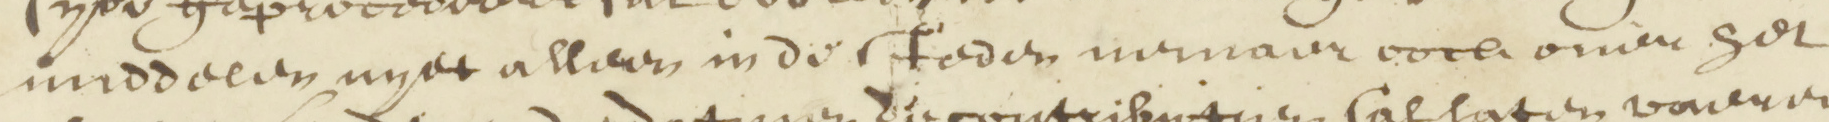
middelen nyet alleen in de steden nemaer oock ouer het
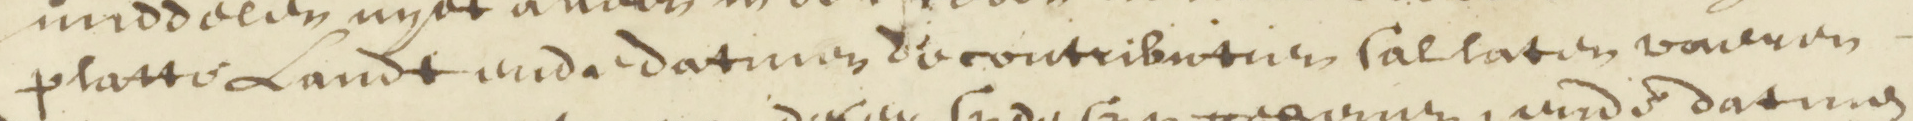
platte Landt ende datmen de contributien sal laten vaeren
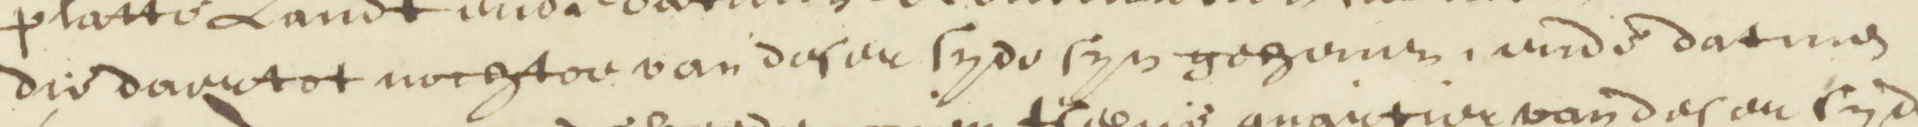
die daer tot nochtoe van deser syde syn geheuen, ende dat men
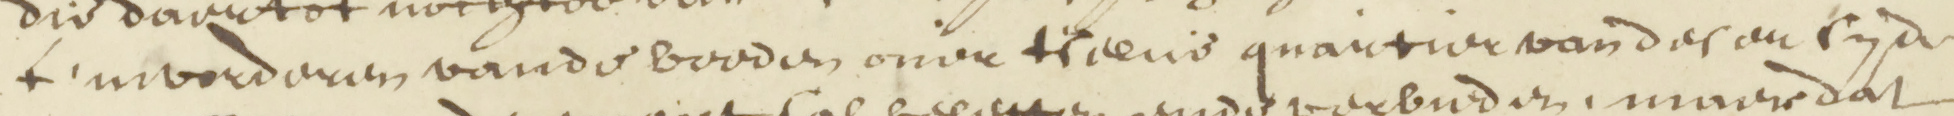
t'invorderen vande beeden ouer tselue quartier van deser syde
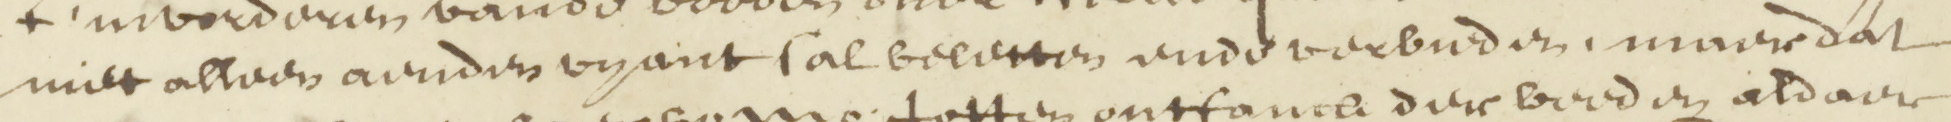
niet alleen aenden vyant sal beletten ende verbieden, maer dat
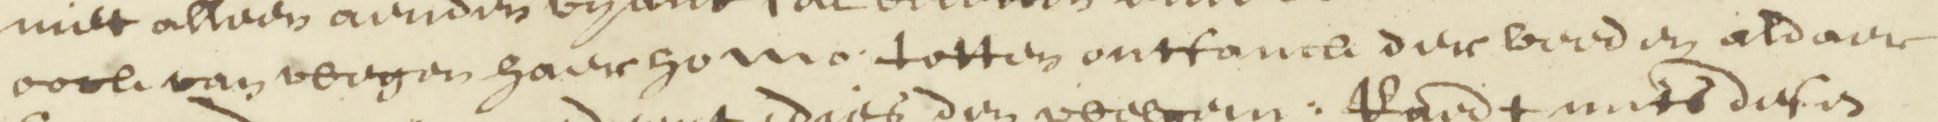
oock van wegen haer hoMo: totten ontfanck der beeden aldaer
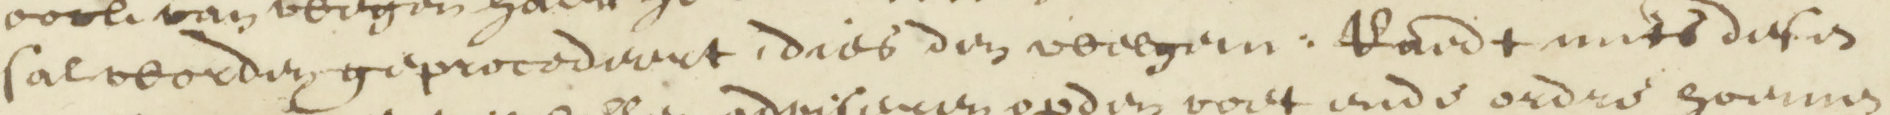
sal worden geprocedeert, dies den welgem: Raedt mits desen
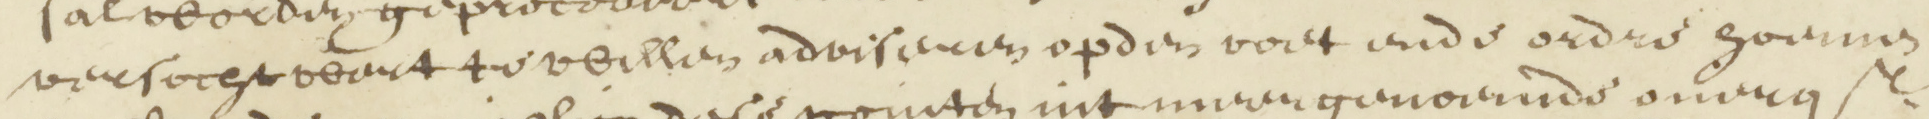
versocht wert te willen adviseren opden voet ende ordre hoemen
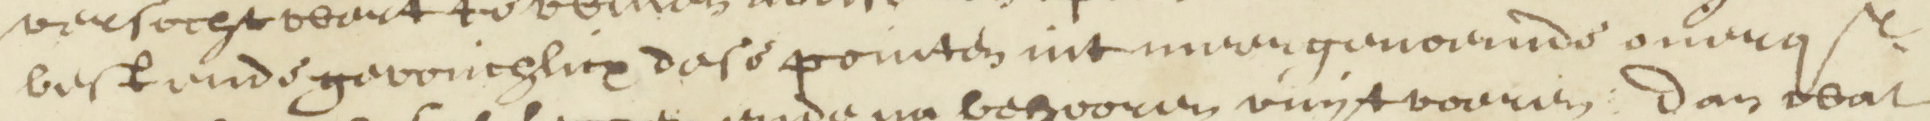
best ende gevouchlicx dese pointen int meergenoemde ouerqr.
